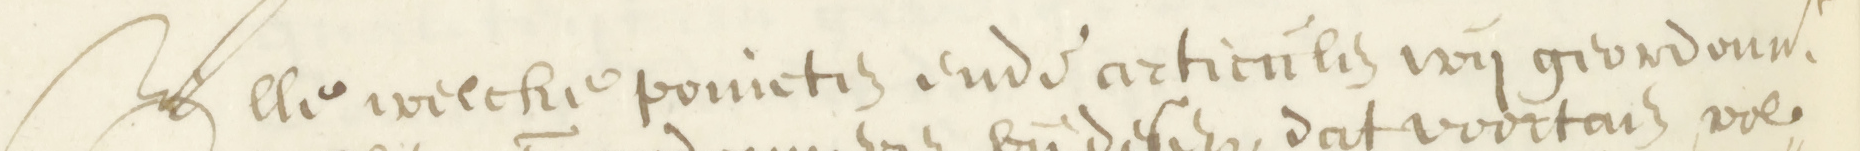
Alle welcke poincten ende articulen wij geordonnt.
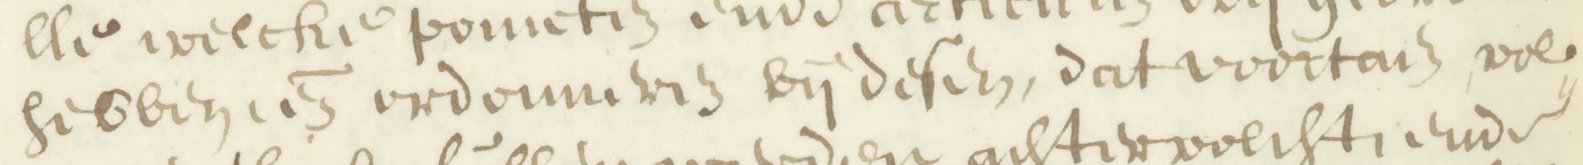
hebben, en ordonneren bij desen, dat voortaen vol„
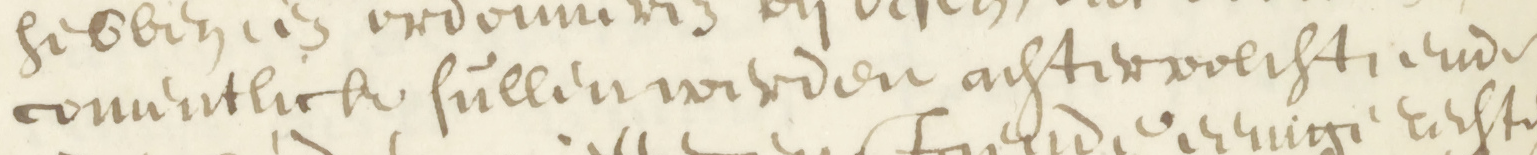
comentlick sullen werden achtervolcht, ende
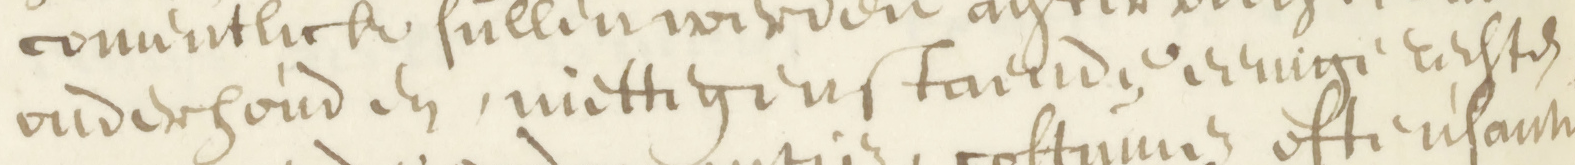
onderhouden, niettegenstaende eenige rechten
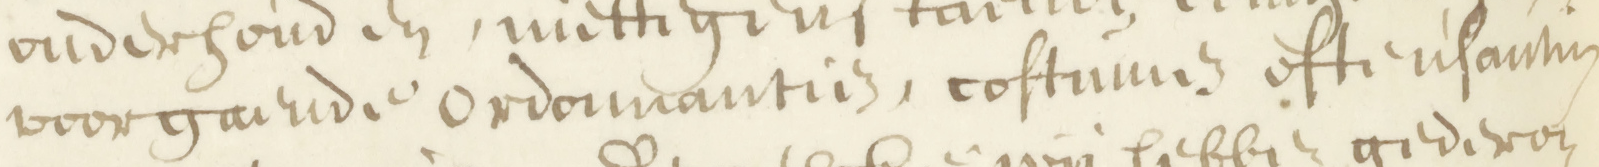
voorgaende Ordonnantien, costumen often usantin
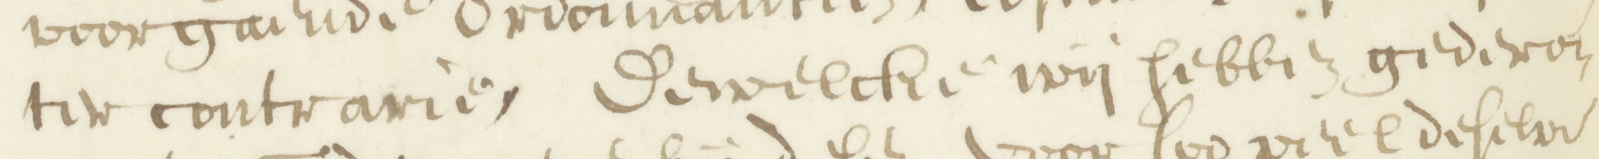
ter contrarie. Dewelcke wij hebben gedero„
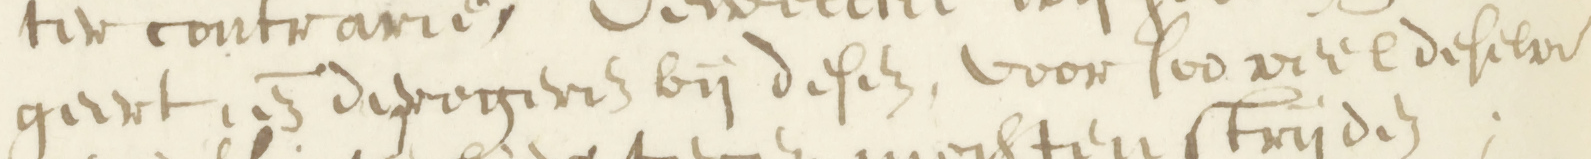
geert en derogeren bij desen, voor soo veel deselve
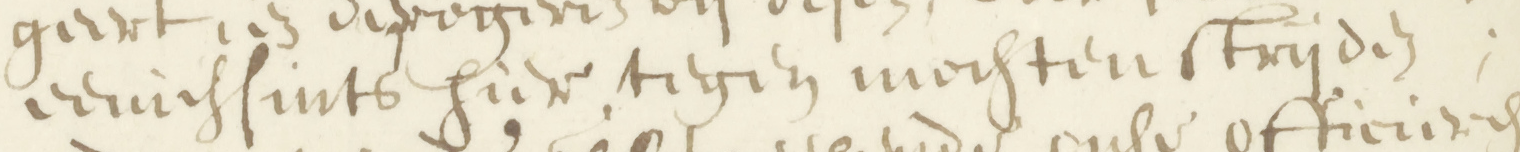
eenichsints hier tegen mochten strijden;
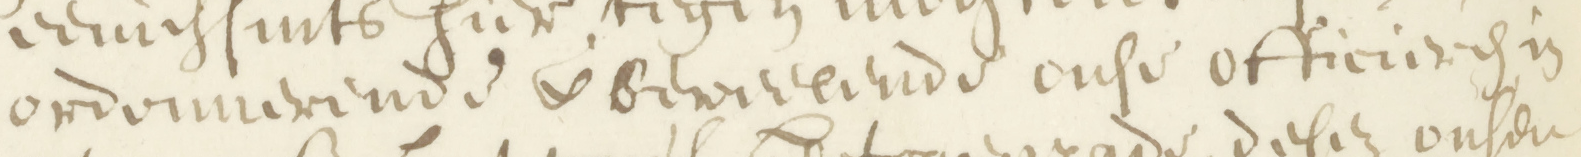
ordonnerende & beveelende onse officieren in
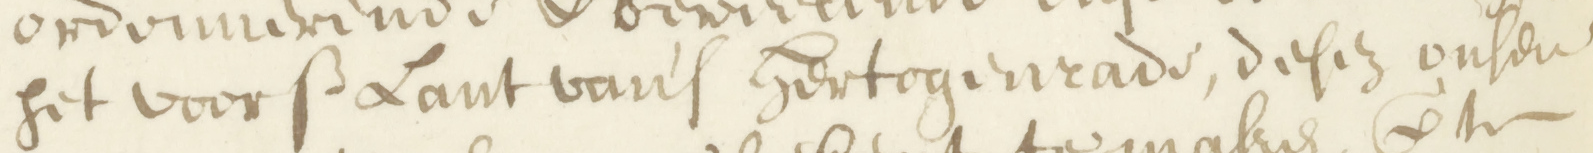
het voors Lant van‛s Hertogenrade, desen onsen
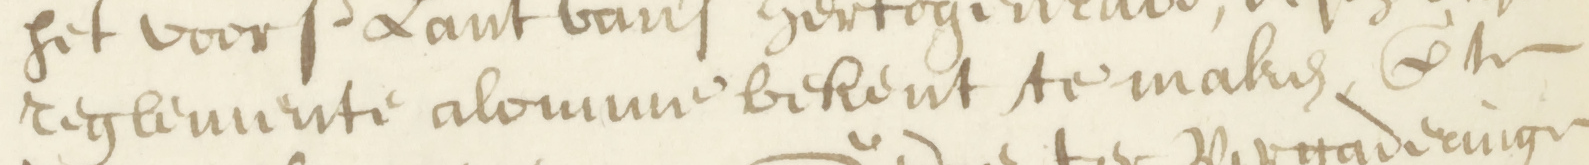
reglemente alomme bekent te maken & te
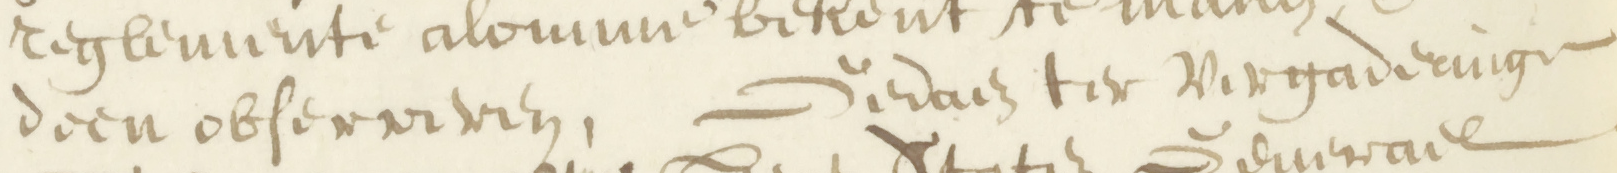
doen observeren. Gedaen ter Vergaderinge
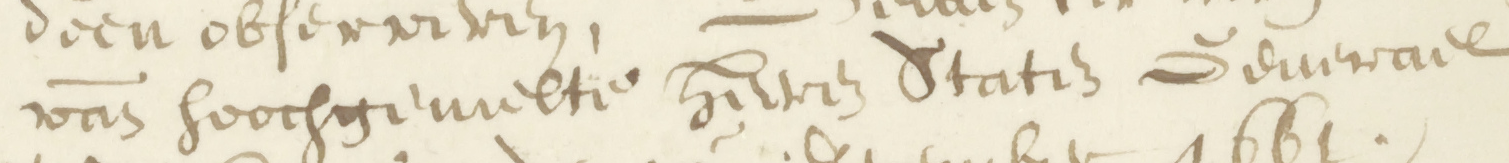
van hoochgemelte Heeren Staten Generael
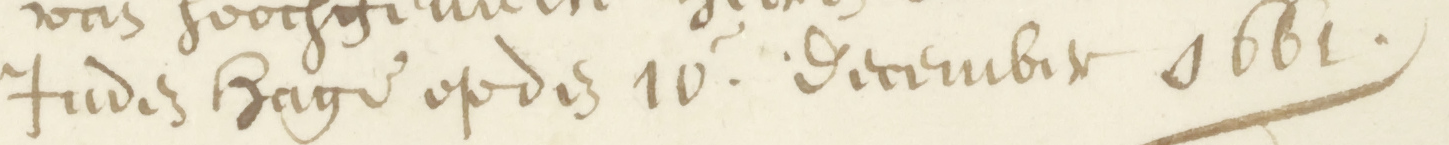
Inden Hage opden 10e. December 1661.
